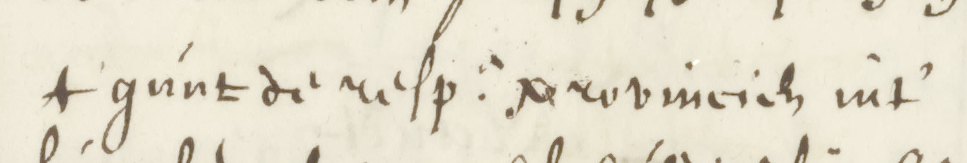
t'gunt de respe. provincien int'
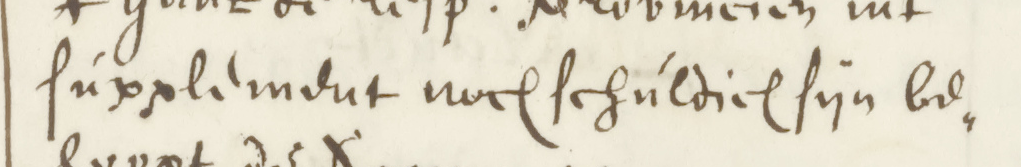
supplement noch schuldich sijn be„
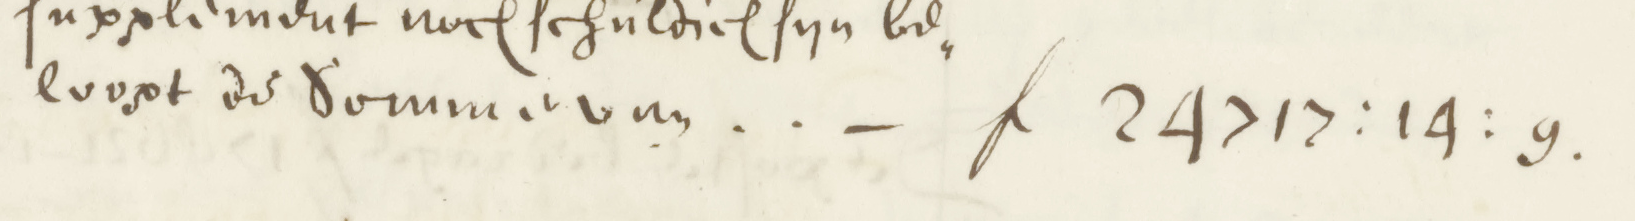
loopt de Somme van..- f 24717: 14: 9.
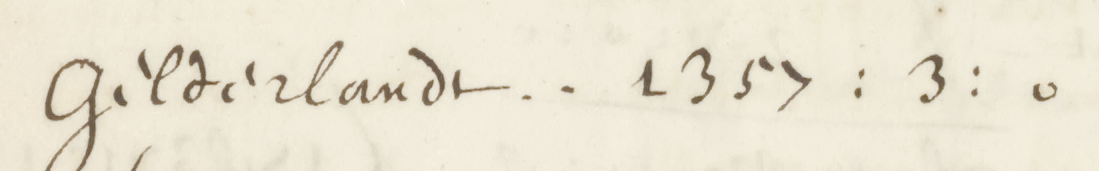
Gelderlandt.. 1357: 3: 0
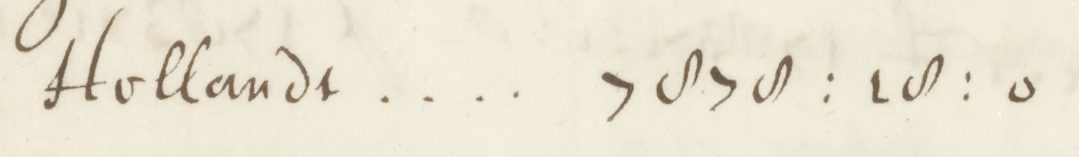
Hollandt...7878: 18: 0
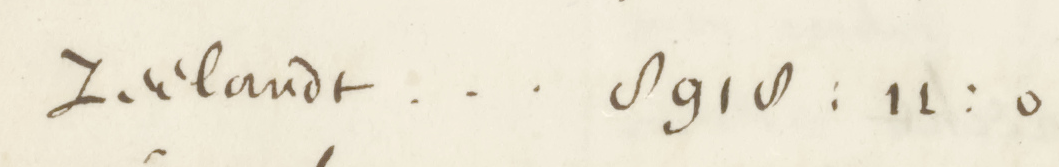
Zeelandt... 8918: 11: 0
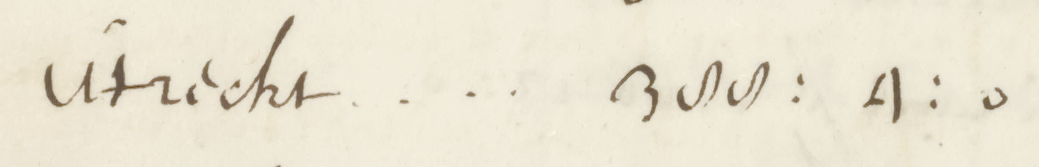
Utrecht.... 388: 4: 0
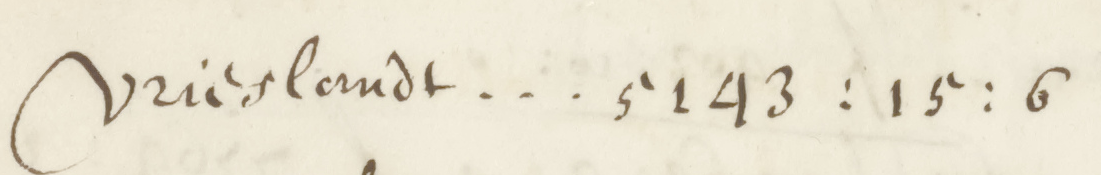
Vrieslandt...5143: 15: 6
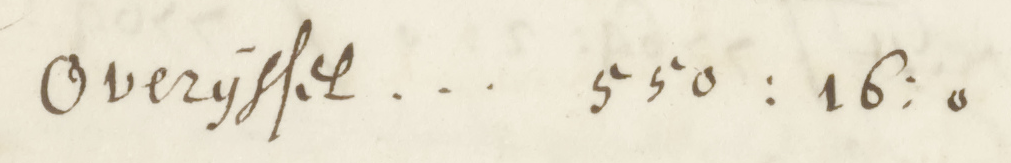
Overijssel... 550: 16: 0
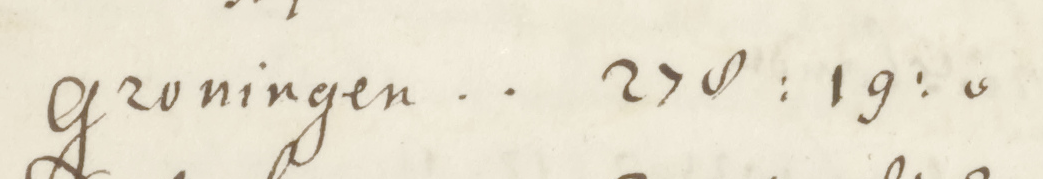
Groningen.. 278: 19: 0
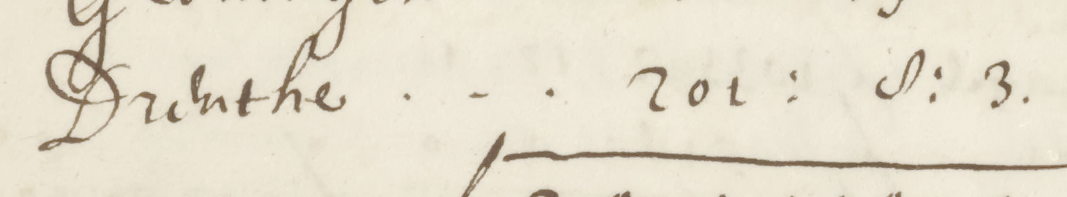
Drenthe... 201: 8: 3.
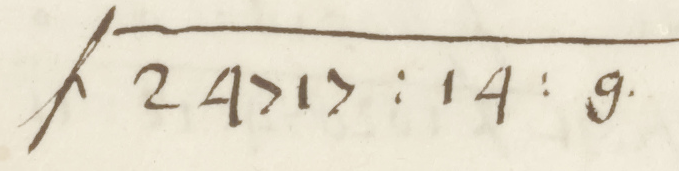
f 24717: 14: 9.
